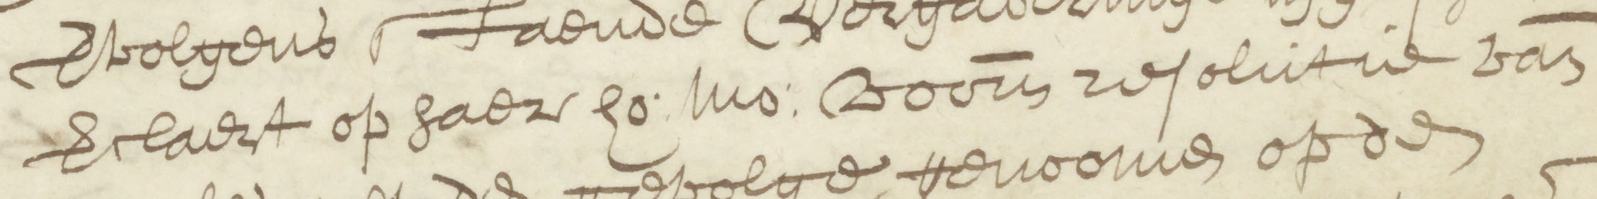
vclaert op haer ho:Mo: voorn resolutie van
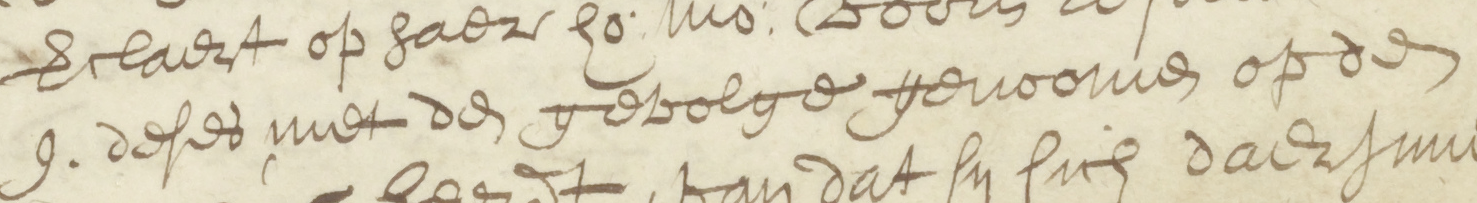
9. deses met den gevolge genoomen op den
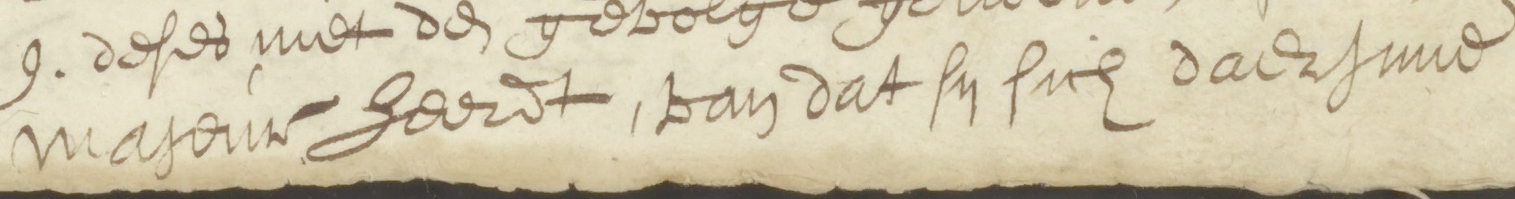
Majeur heerdt, van dat sy sich daerinne
